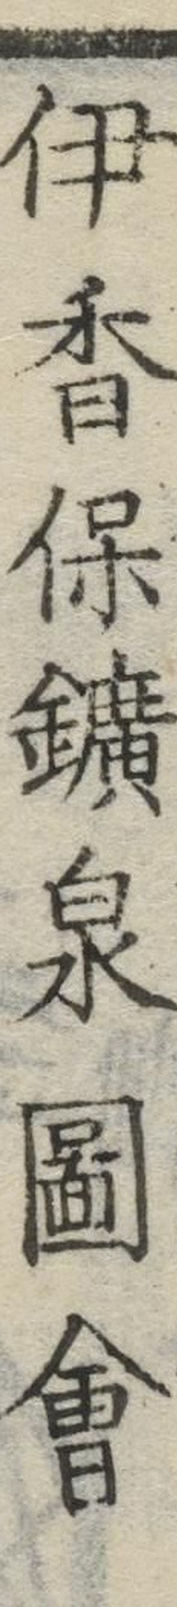伊香保鉱泉図会
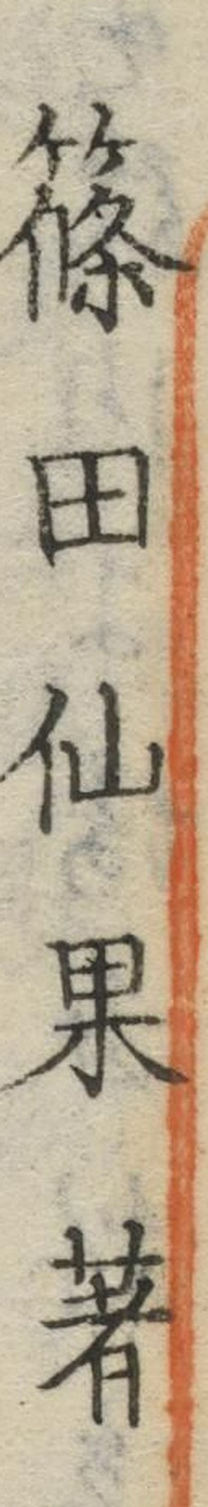篠田仙果著
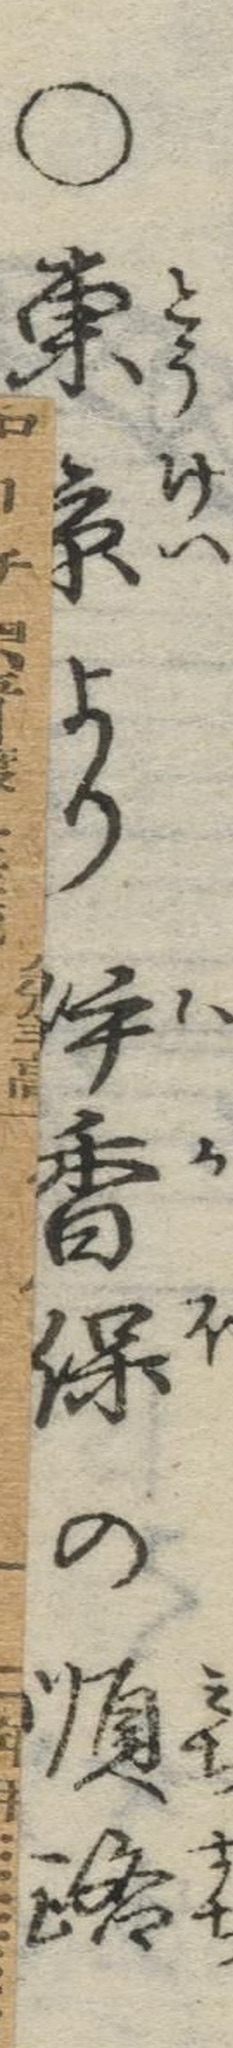○東京より伊香保の順路

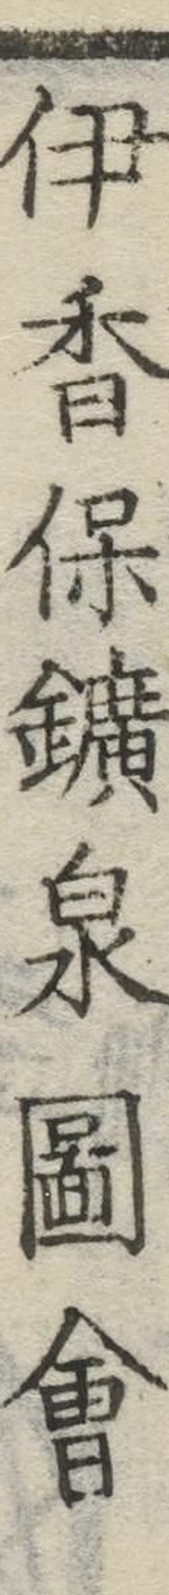伊香保鉱泉図会
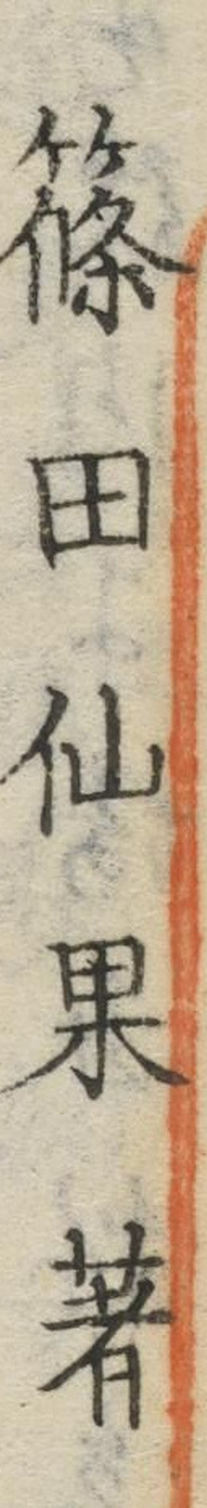篠田仙果著
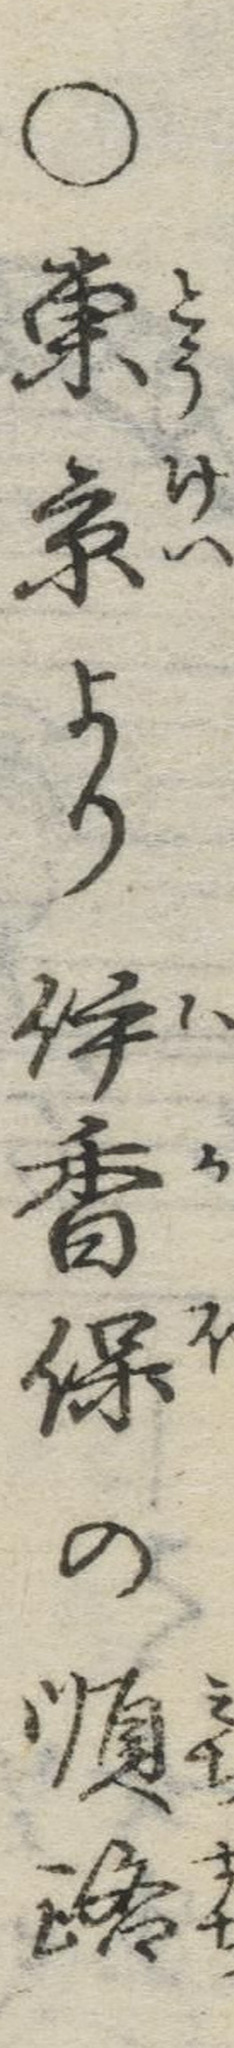○東京より伊香保の順路
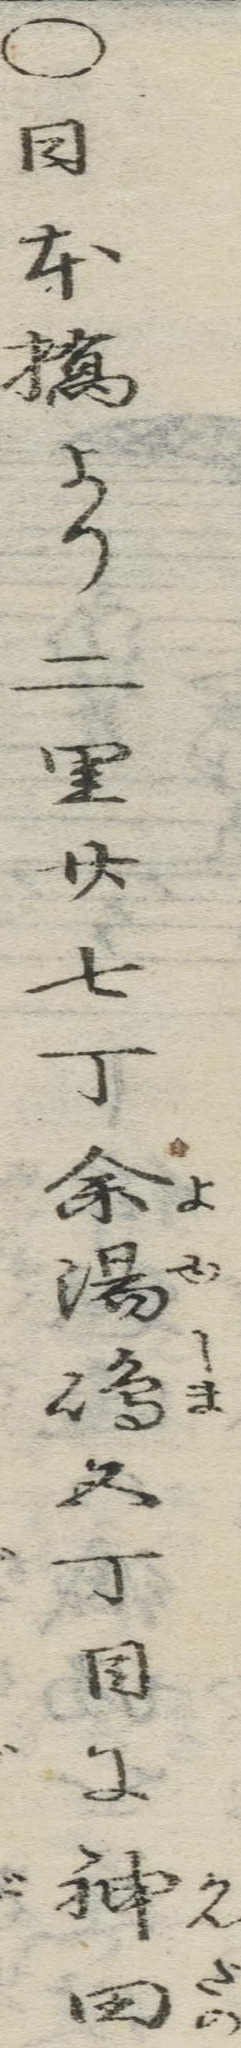○日本橋より二里廿七丁余湯嶋五丁目に神田
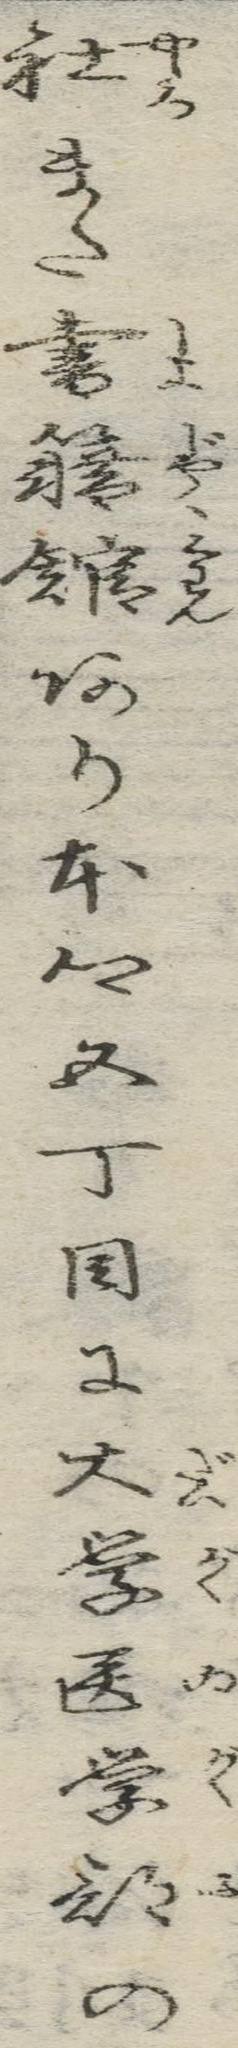社また書籍館あり本郷五丁目に大学医学部の
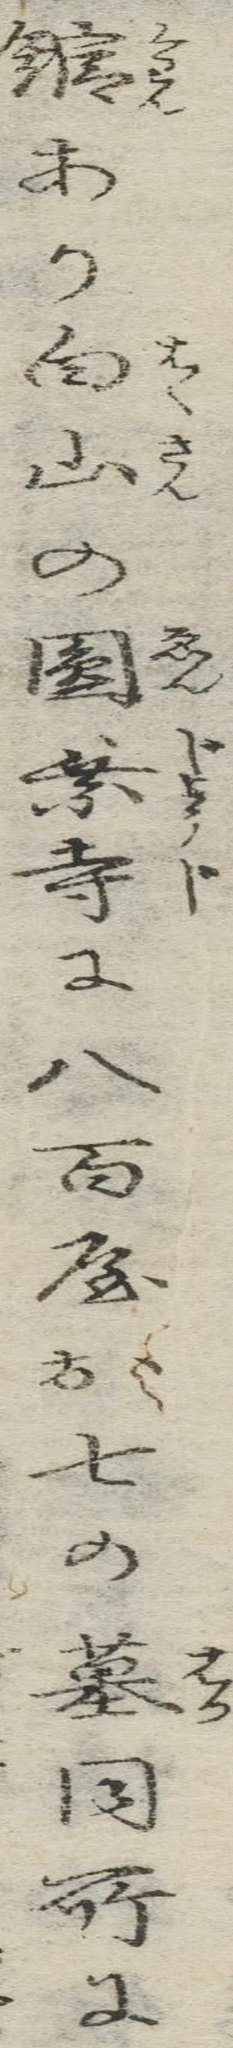館あり白山の圓乗寺に八百屋お七の墓同所に
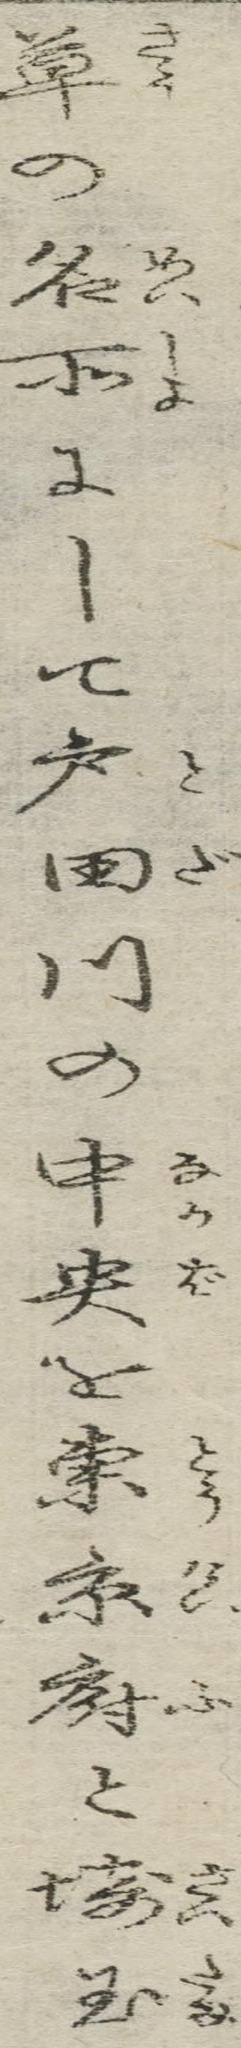草の名所にして戸田川の中央を東京府と埼玉
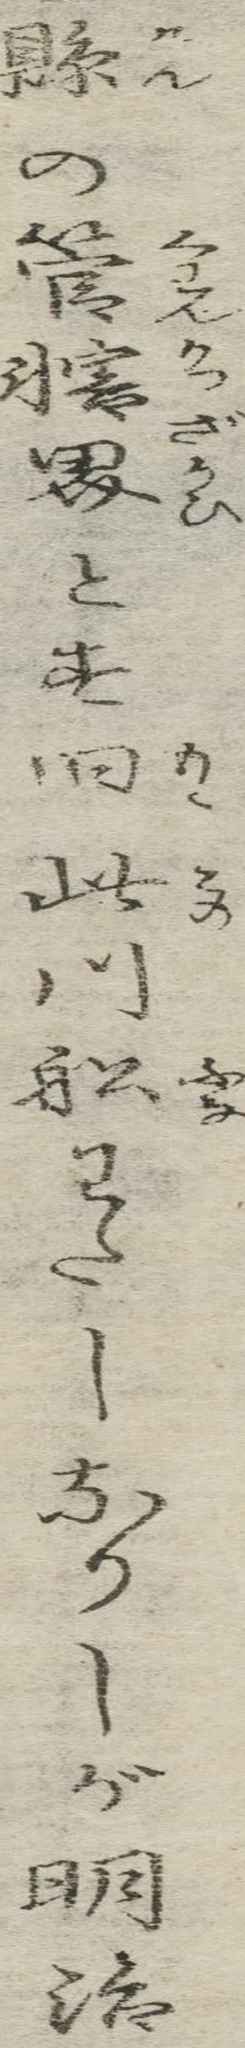縣の管轄界とす旧此川船わたしなりしが明治
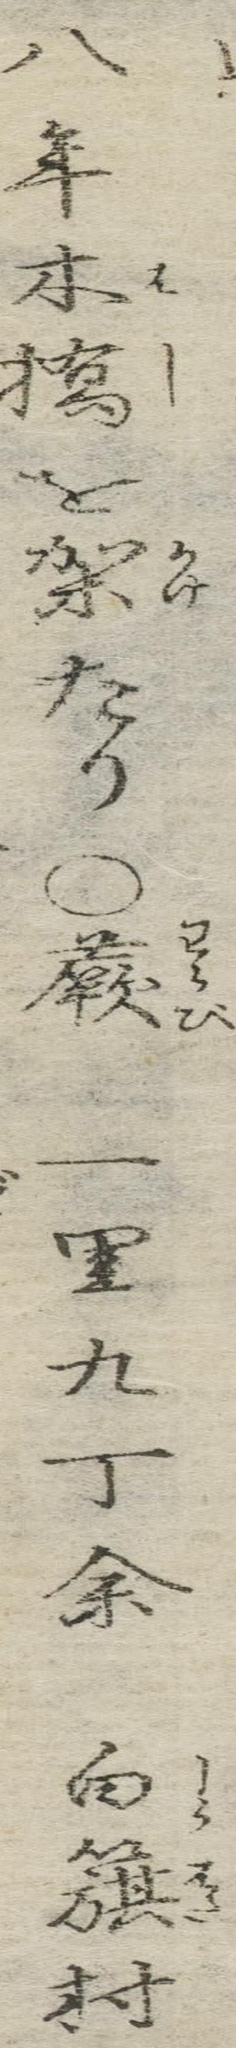八年木橋を架たり○蕨一里九丁余白旗村
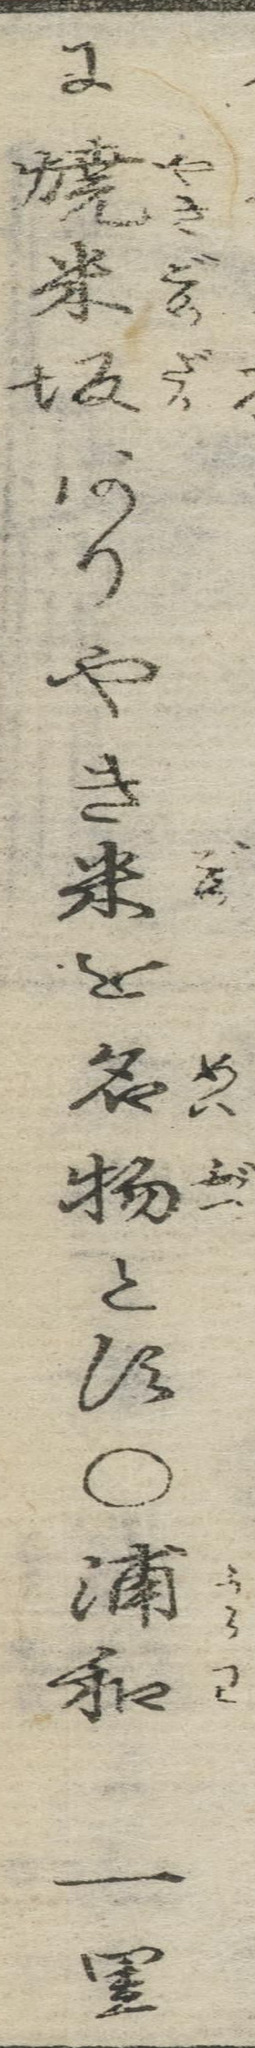に焼米坂ありやき米を名物とす○浦和一里

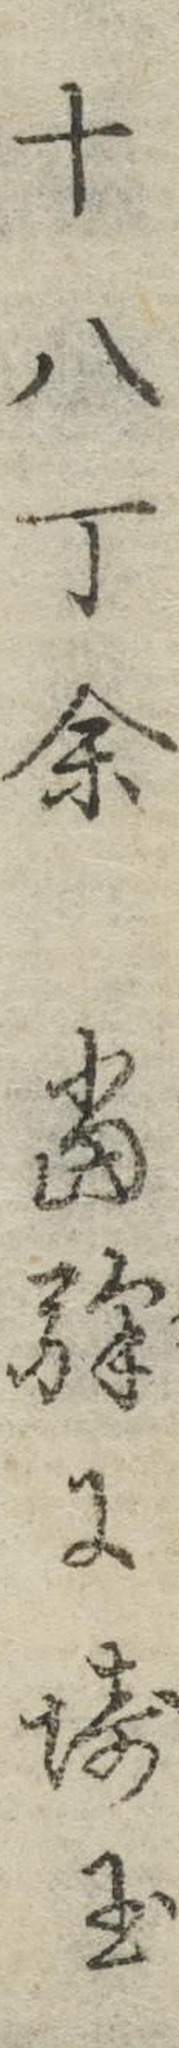十八丁余当駅に埼玉
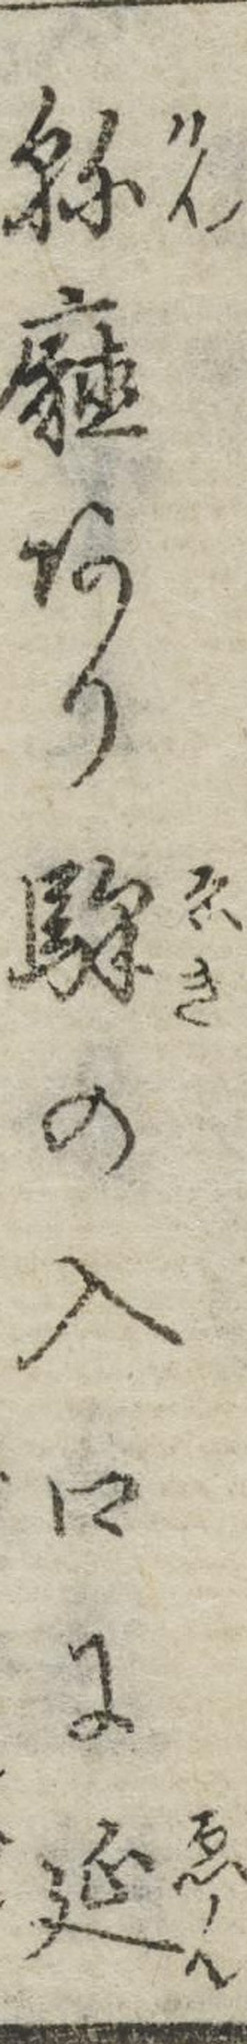縣廰あり駅の入り口に延
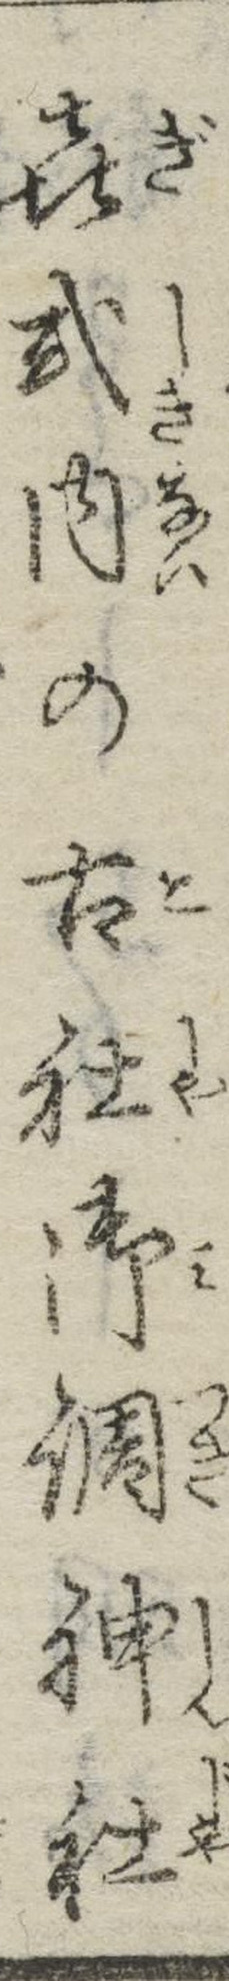喜式内の古社御調神社
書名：上州伊香保鑛泉圖會　全
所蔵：東京大学地震研究所図書室 Earthquake Research Institute Library, The University of Tokyo, JAPAN
